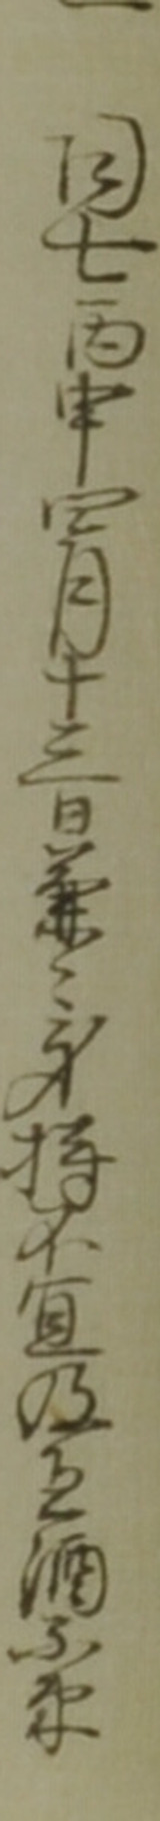一同七丙申四月十三日兼々身持不宜及過酒不束
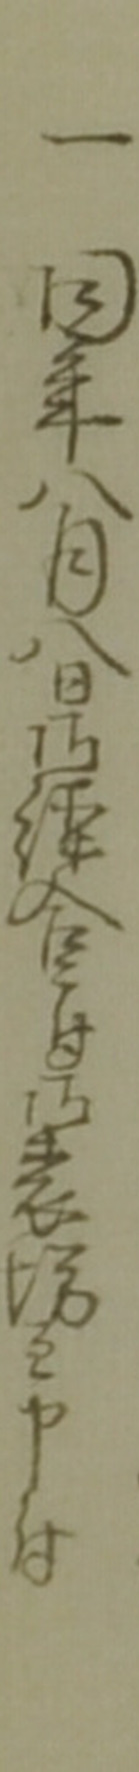一同年八月八日御繰合ニ付御表坊主申付
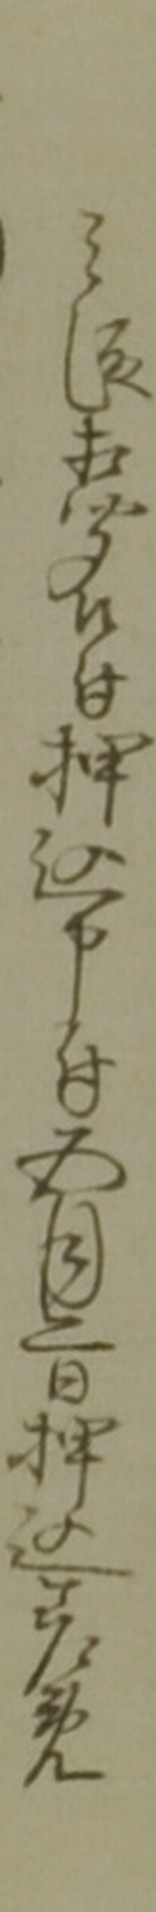之趣相聞候付押込申付五月二日押込差免

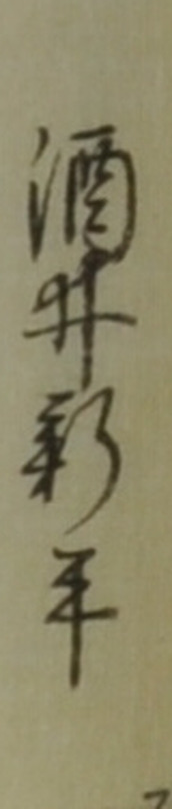酒井新平
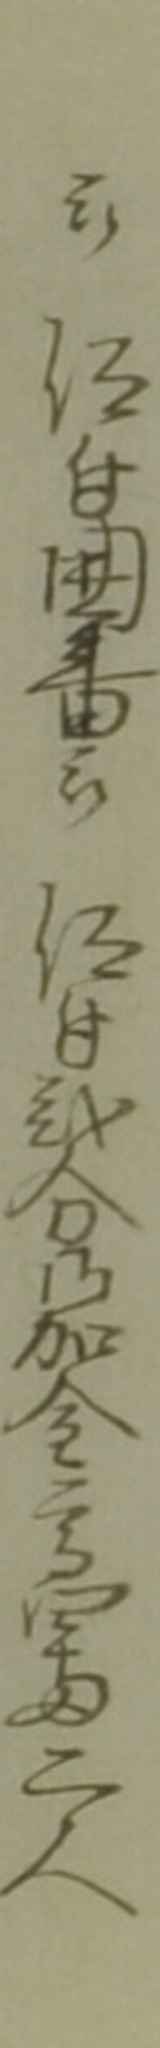被仰付囲番被仰付弐分御加金高四両二人
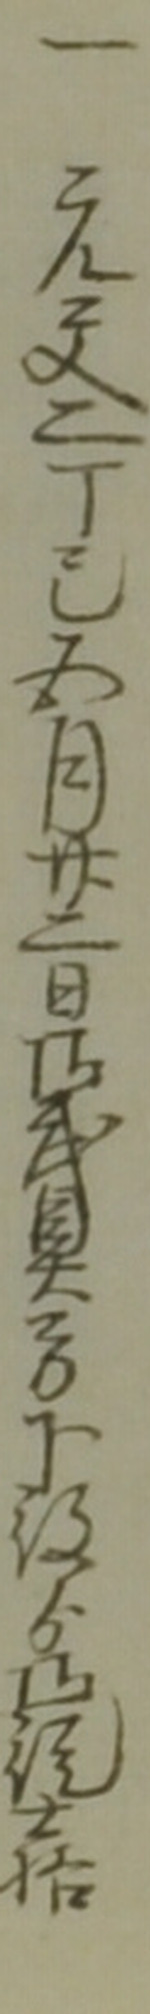一元文二丁巳五月廿二日御武具方下役ゟ御徒士格

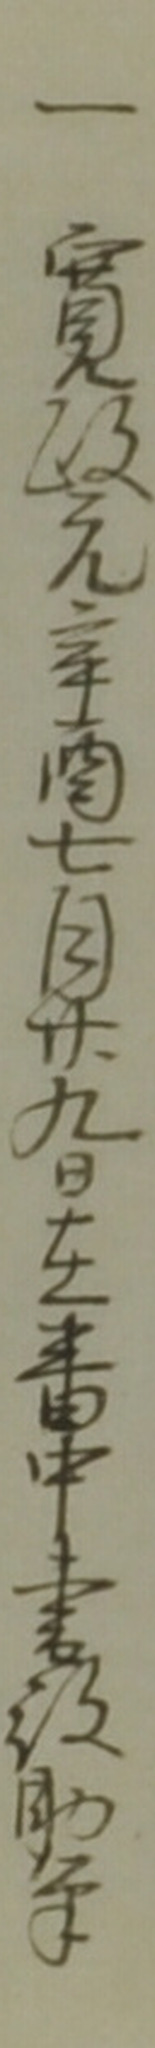一寛政元辛酉七月廿九日在番中書役助筆
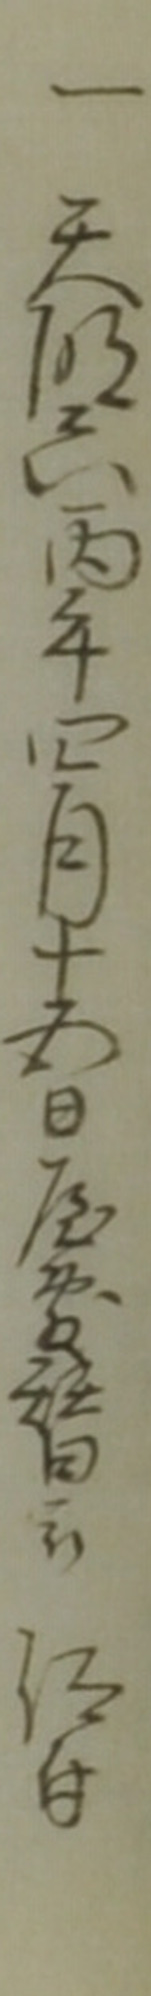一天明六丙午四月十五日屋敷替被仰付
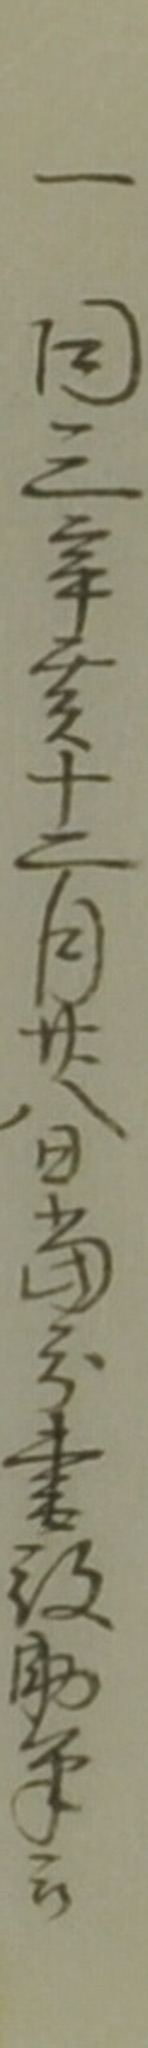一同三辛亥十二月廿八日当分書役助筆被
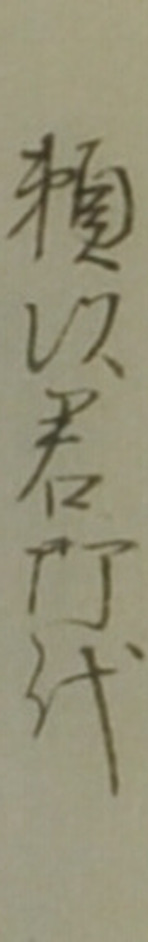頼以君御代
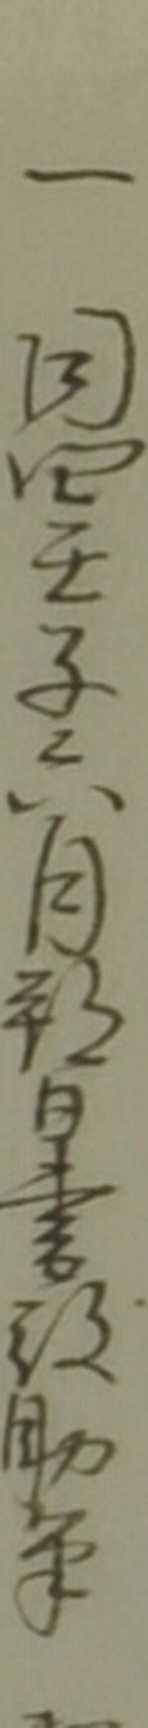一同四壬子六月朔日書役助筆御免
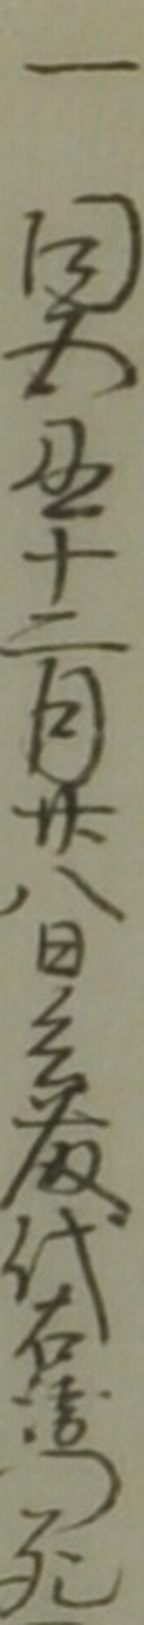一同五丑十二月廿八日兵藤代右衛門死罪被
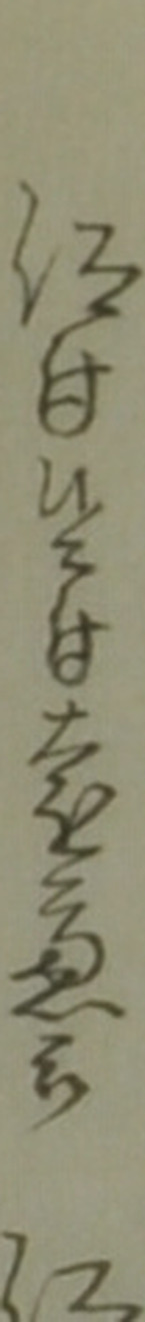仰付候ニ付遠慮被仰付
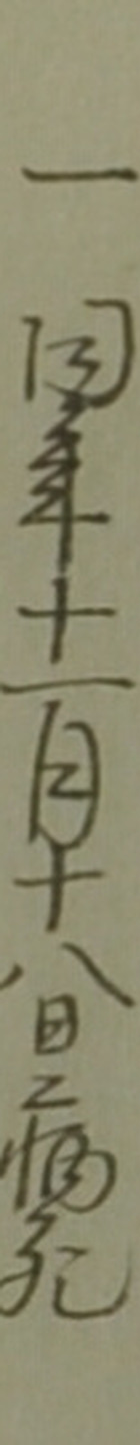一同年十一月十八日病死
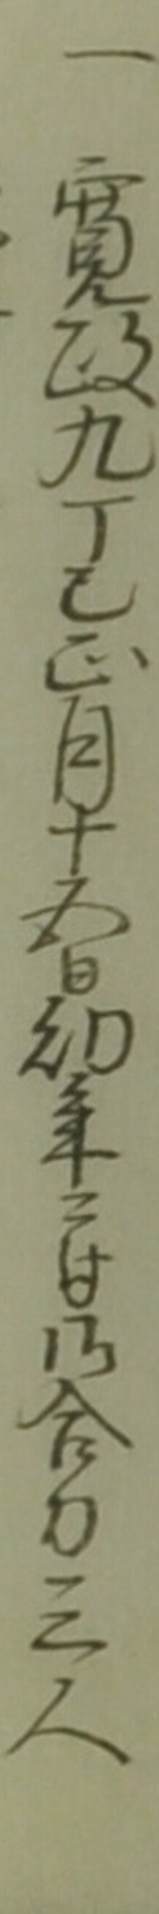一寛政九丁巳正月十五日幼年ニ付御合力三人
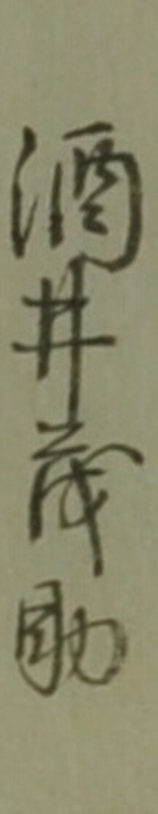酒井茂助
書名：無足諸士勤仕録（九）
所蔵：伊那市立高遠町図書館・合同会社AMANE
